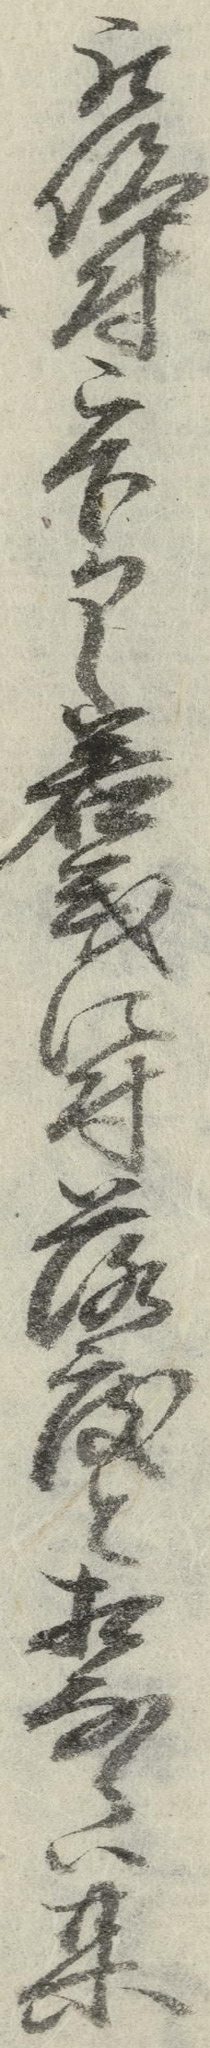被仰付被下りし若義に付落度と相ならは某
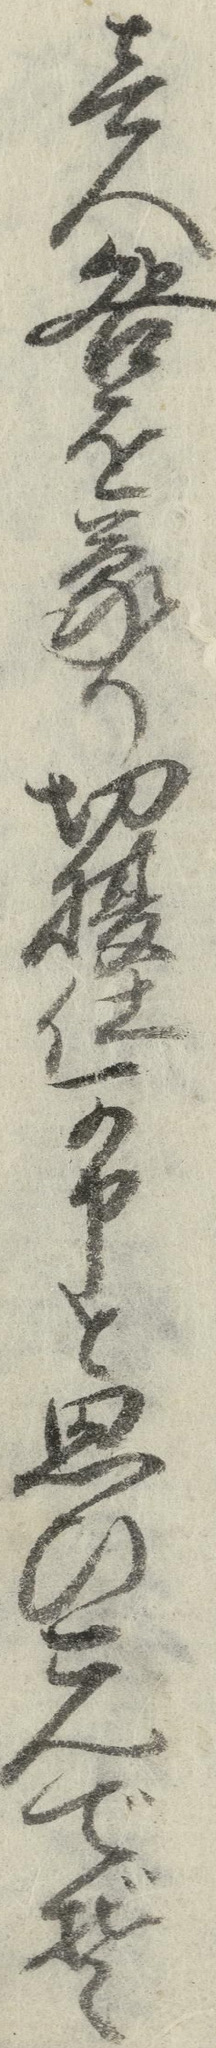壱人咎を蒙り切腹仕可申と思ひこんでぞ
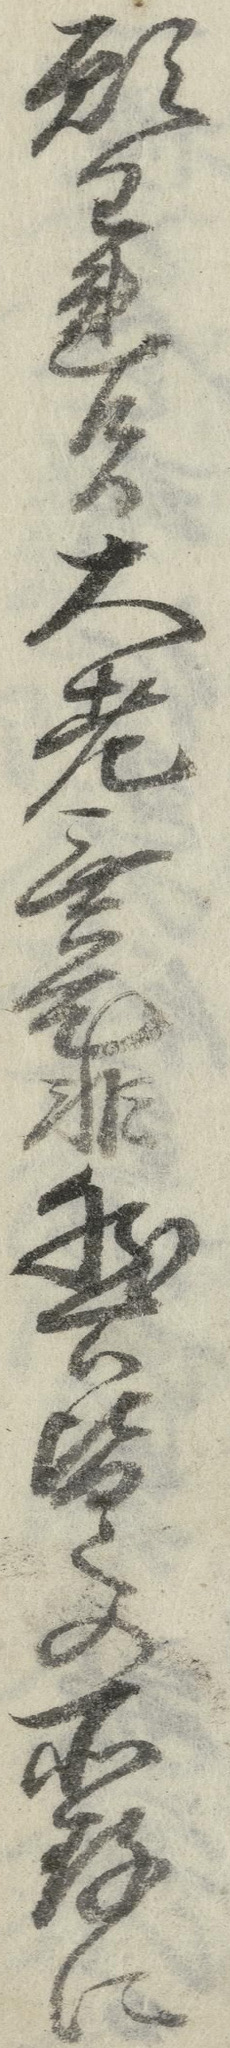願われける大老無是非然は皆々の所存に
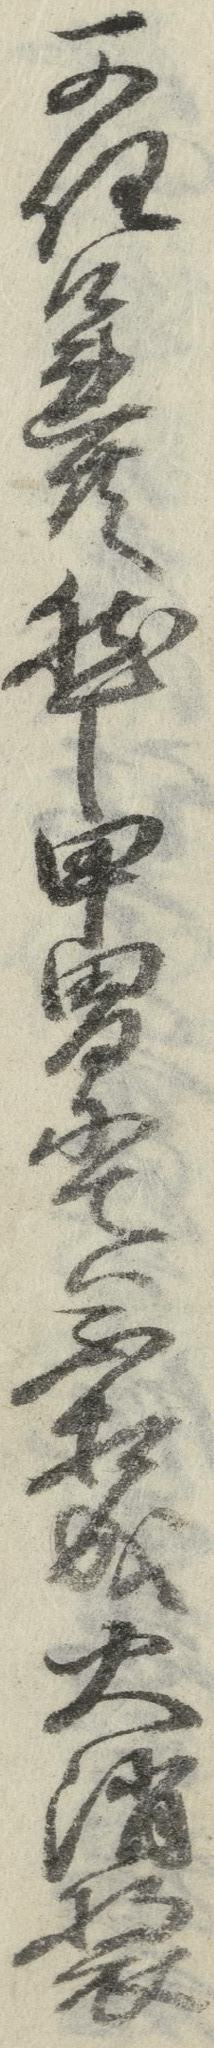可任けれ共然し甲冑にては不相成火消装
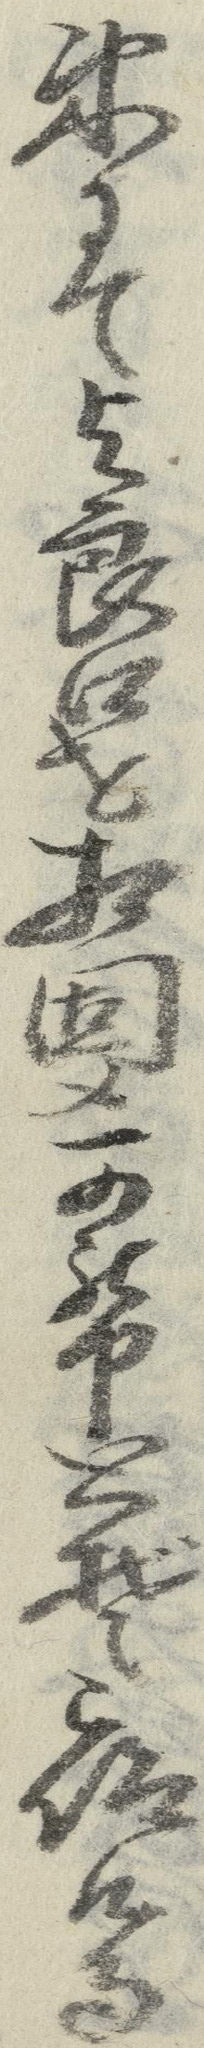束にて与良口を相固メ可被申とぞ被仰ける
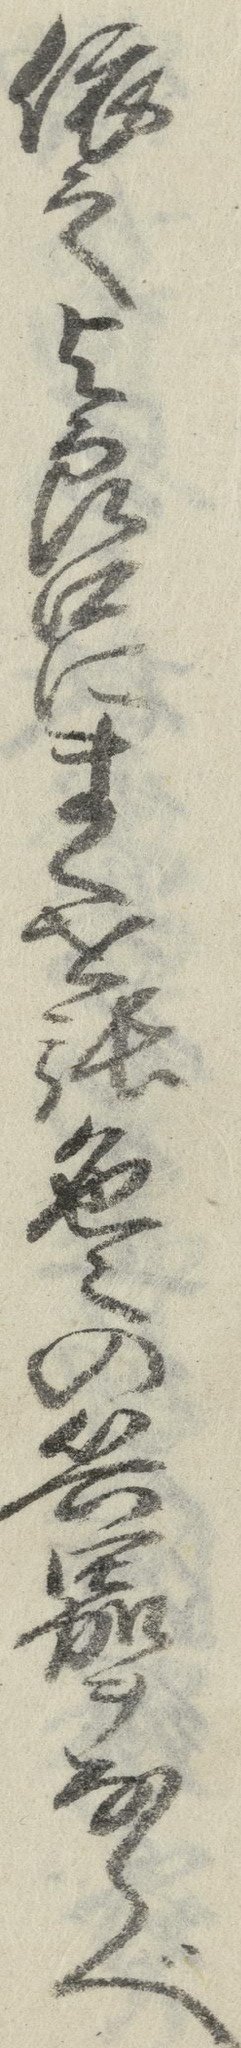依之与良口にまくを張色々の兵器？ヲならべ
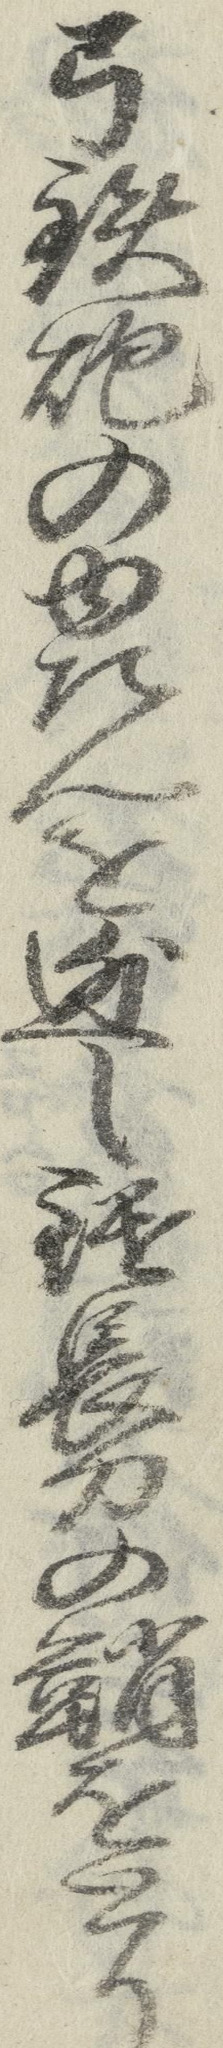弓鉄炮のゆたんを迯し鑓長刀の鞘をとり
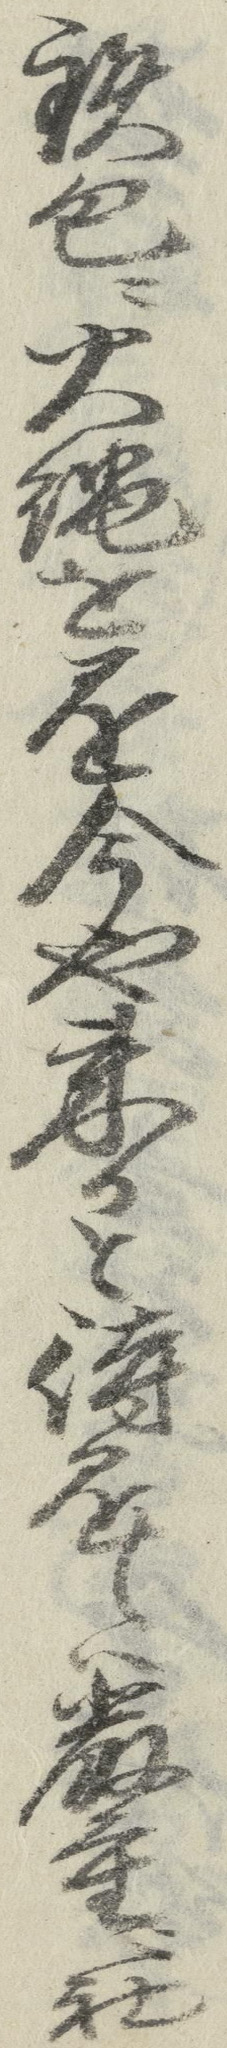鉄包に火縄を懸今や来かと待懸しは厳重に被
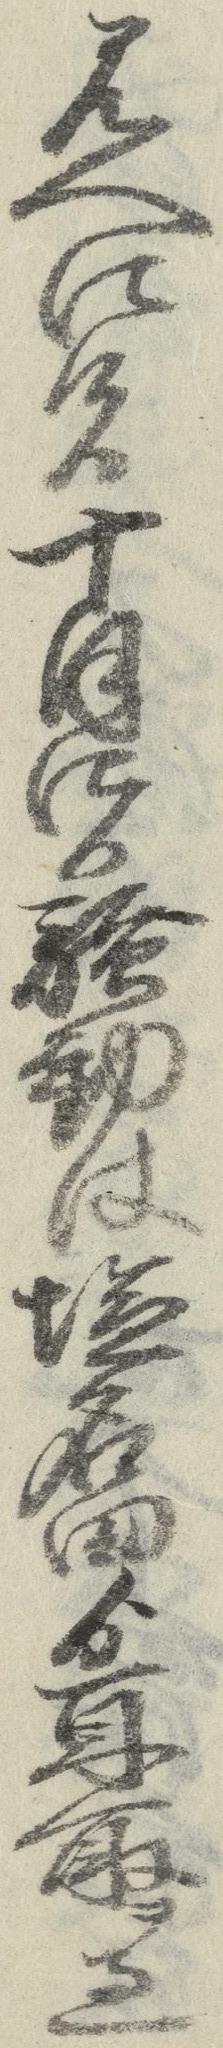見へにける十月四日騒動は塩名田ゟ耳取過
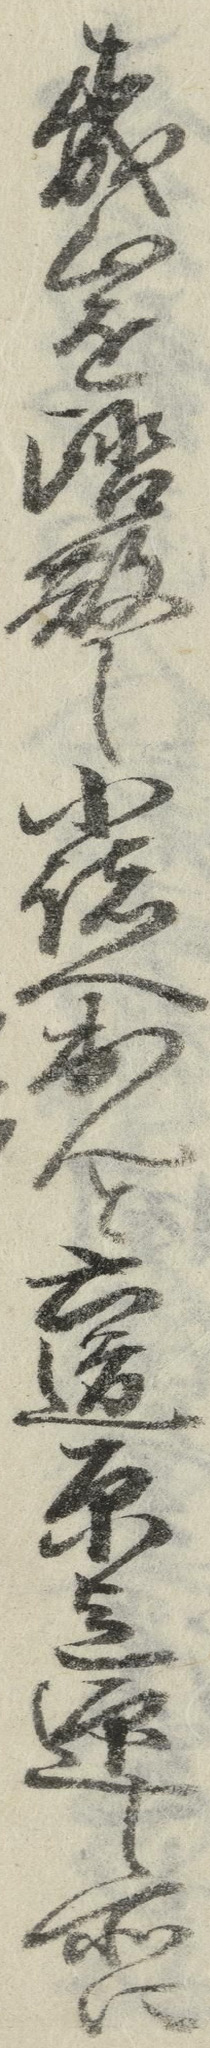森山を踏散し小諸へ出んと六道原迄迎し所に
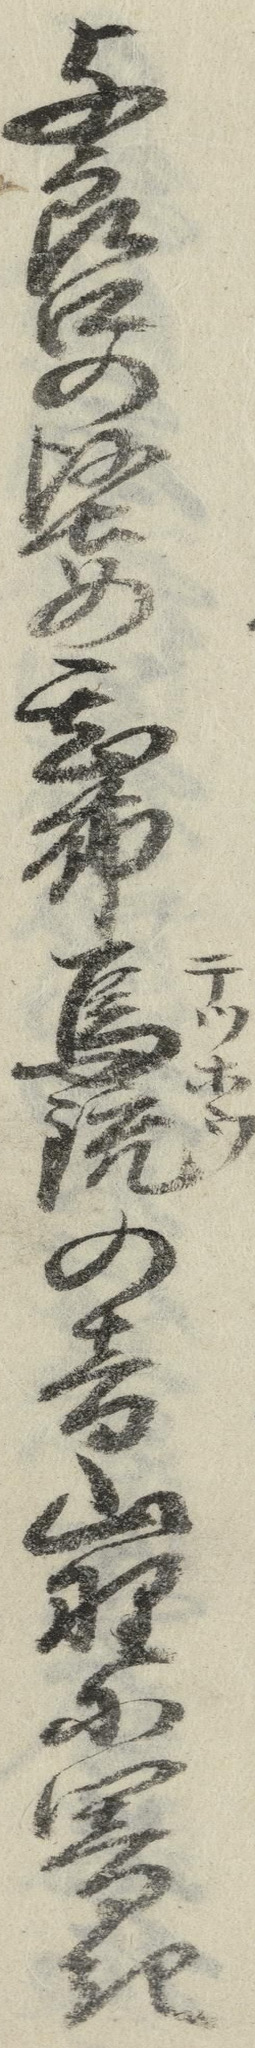与良口の堅め甚布-鳥統の音山野に響き

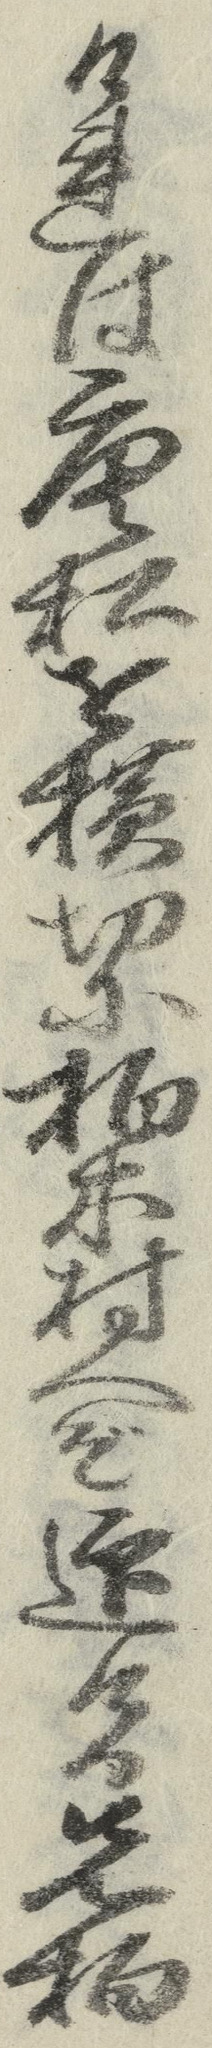けれは唐松を横切に柏木村へぞ迎ける先柏
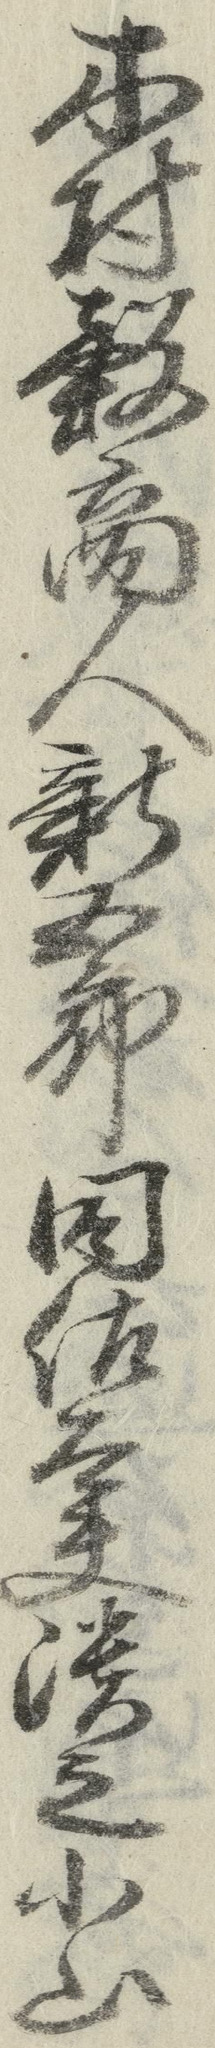木村穀商人新五郎同左太夫潰之小山
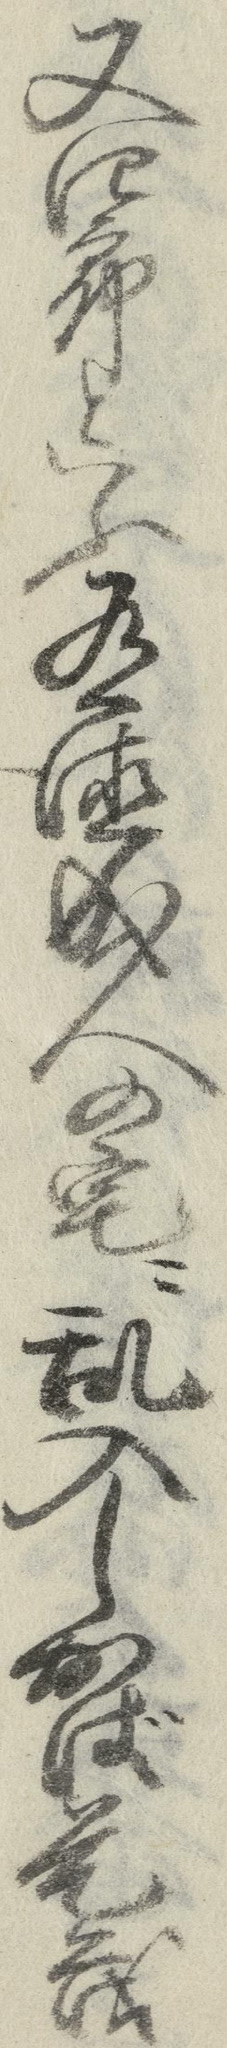又四郎といふ有徳成人の宅に乱入しかば是も
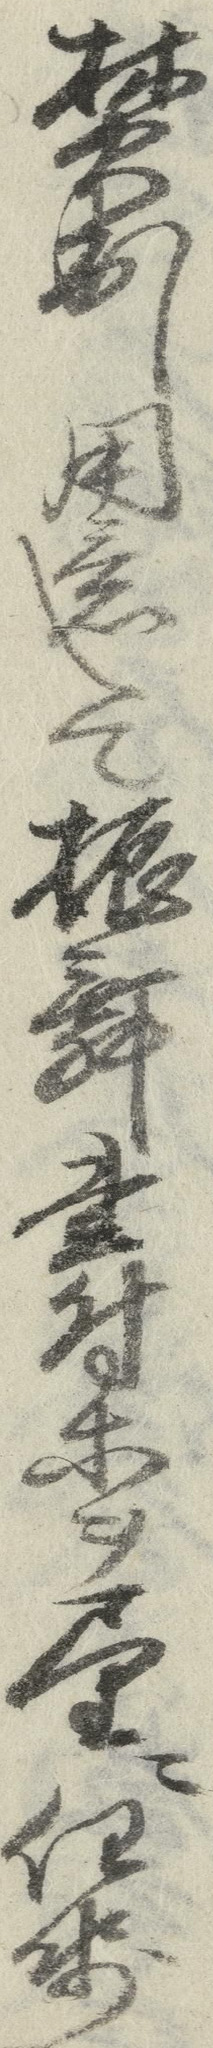焚出し用意して振舞書付等ヲ望に任決
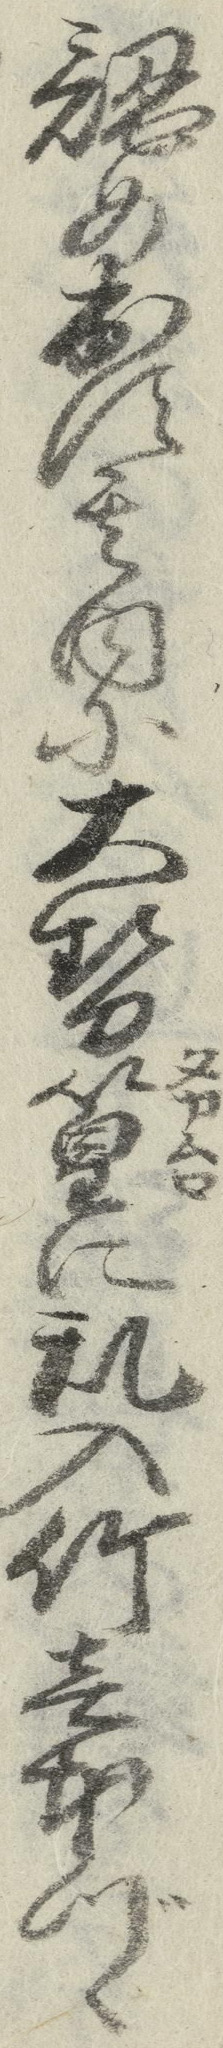認め出す其内に大勢篁に乱入竹壱本づゝ
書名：浅間大焼騒動記　下
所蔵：東京大学地震研究所図書室 Earthquake Research Institute Library, The University of Tokyo, JAPAN
